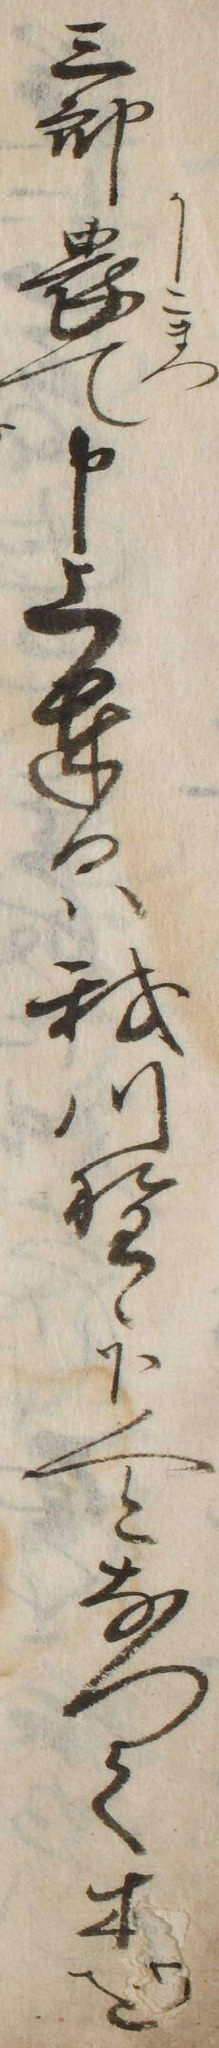三郎畏て申上奉るは我川野ゝ下人となつて木を
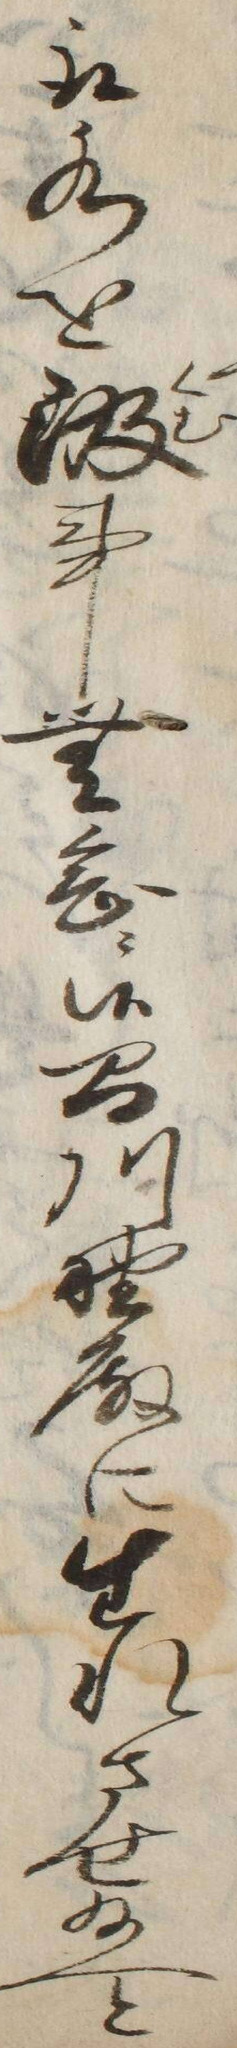取水を汲事無念に候間川野殿に生れさせ給へと
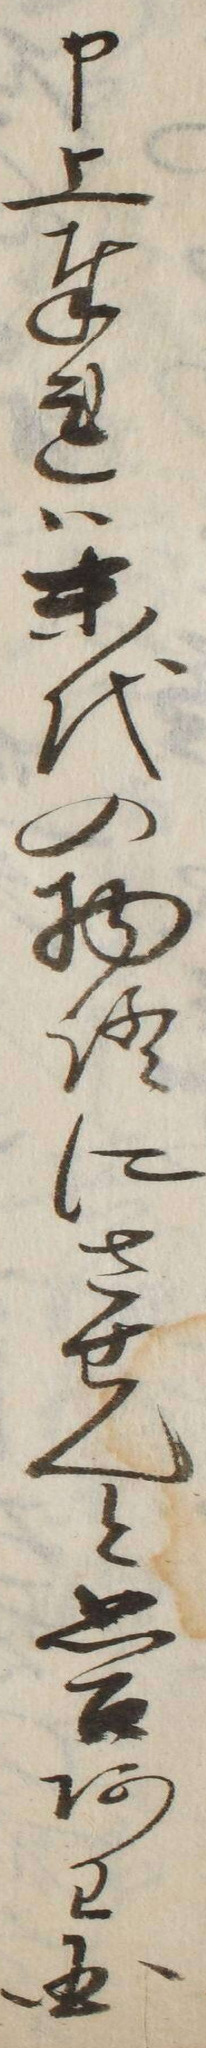申上奉れは末代の物語にさせんと思召あわ国
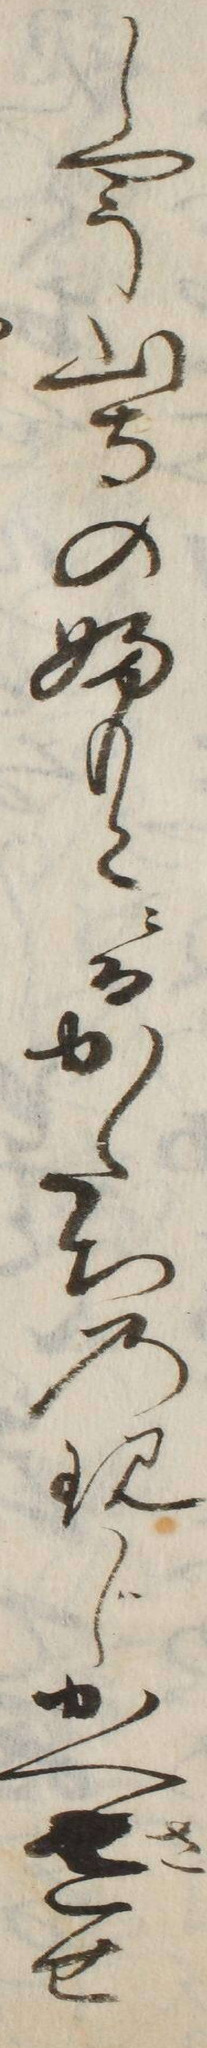しやう山寺のふもとにてかたちの現じかへさせ
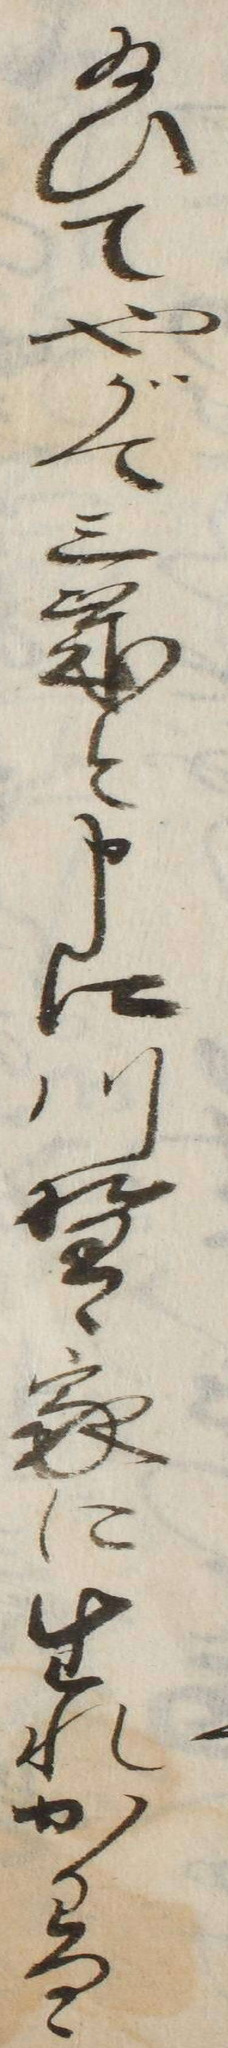給ひてやがて三歳と申に川野ゝ家に生れかわるゝ
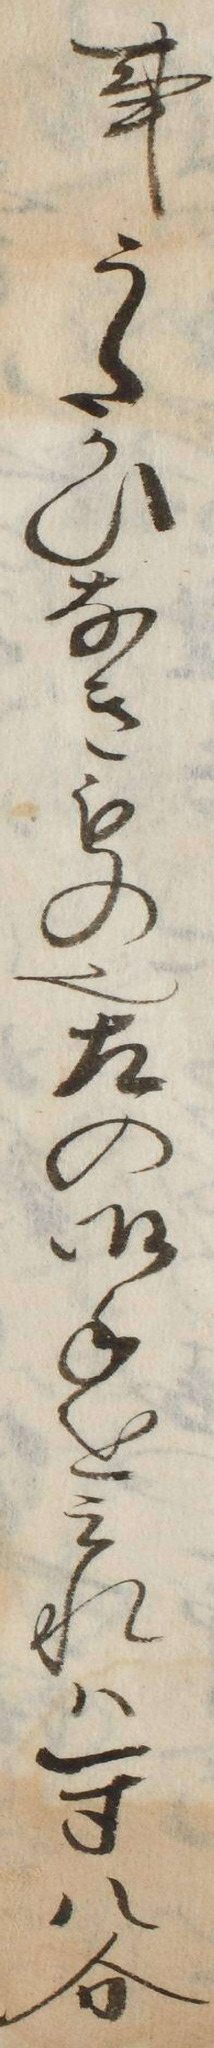事うたかひなきもの也左の御手をみれは一寸八分
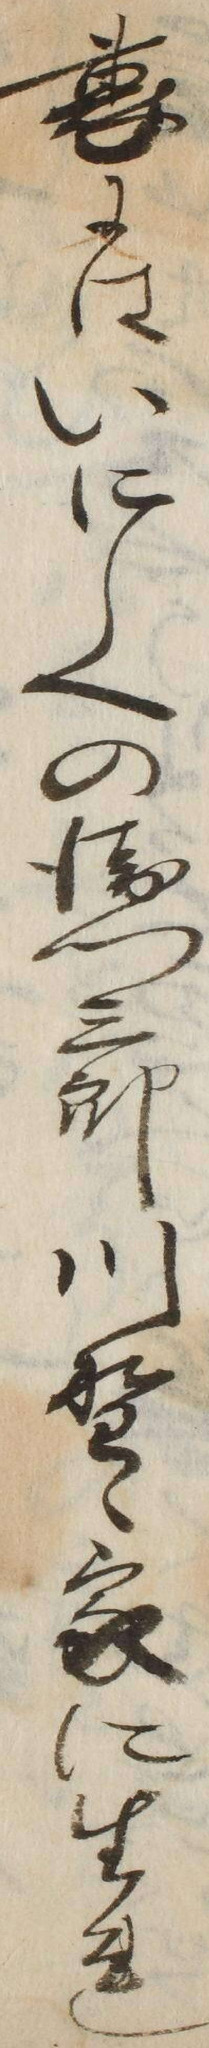裏にはいにしへの衛門三郎川野ゝ家に生れ
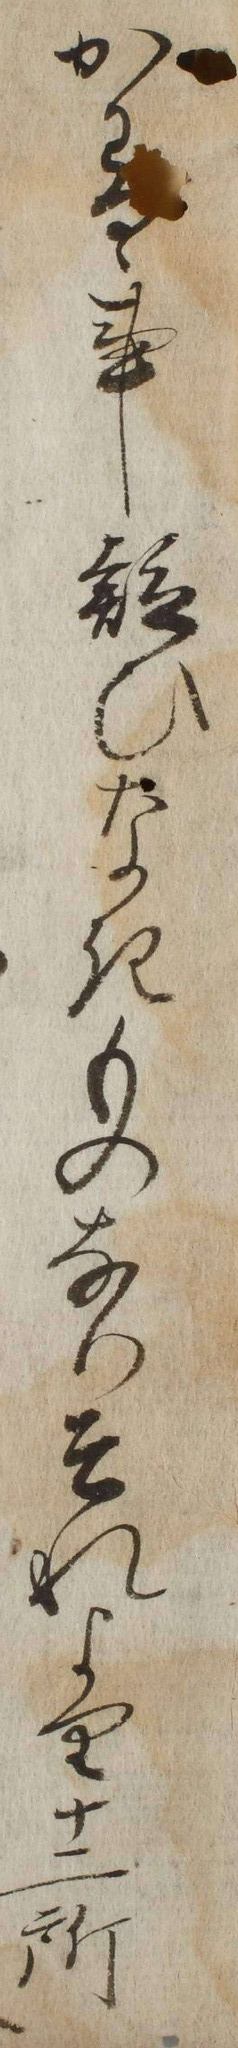かわるゝ事疑ひなきものなりそれより十二所
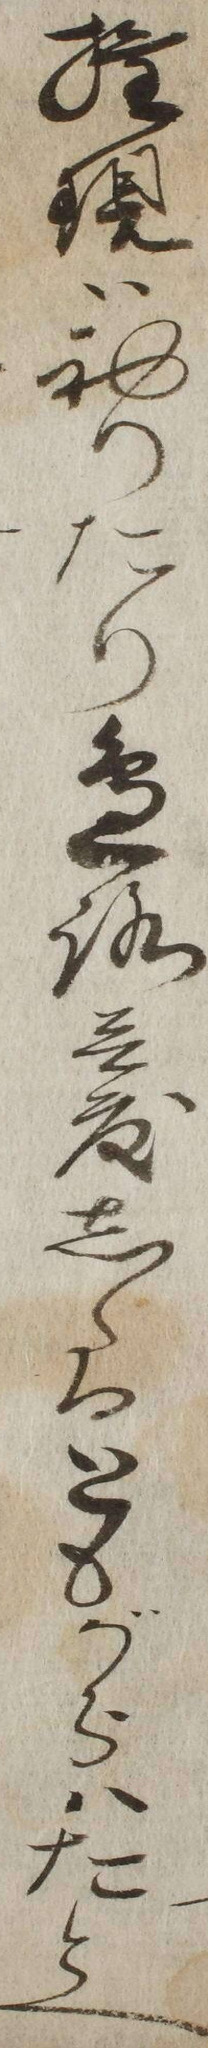権現は初りたり遍路壱度したるともがらはたとへ
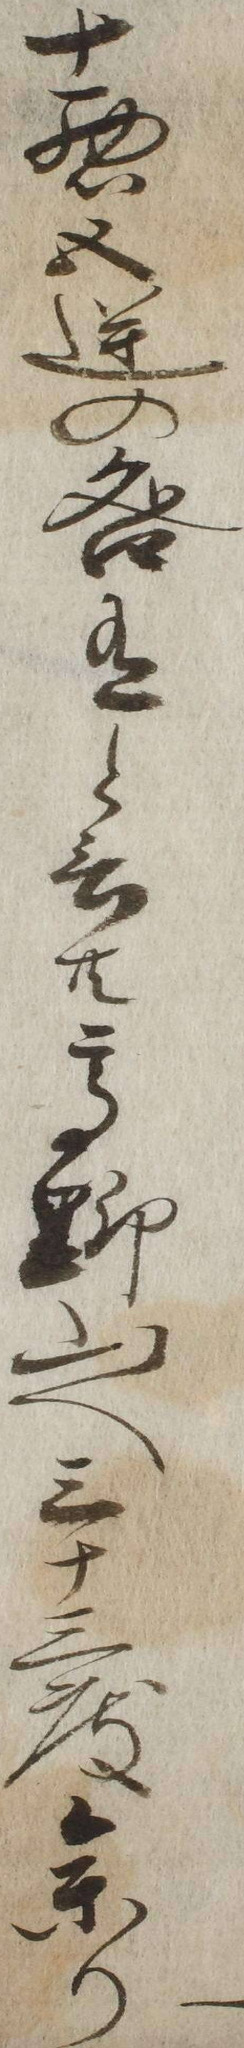十悪五逆の咎有と言共高野山へ三十三度参り
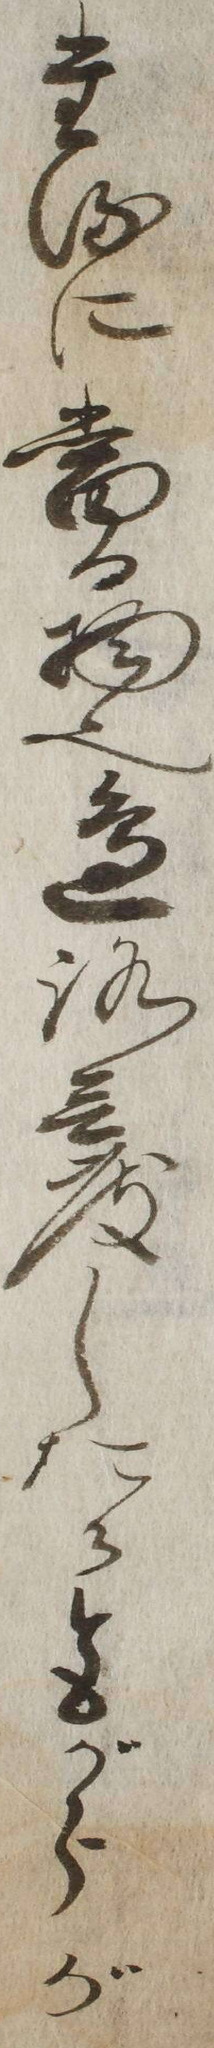たるに当る物也遍路壱度したるともがらが
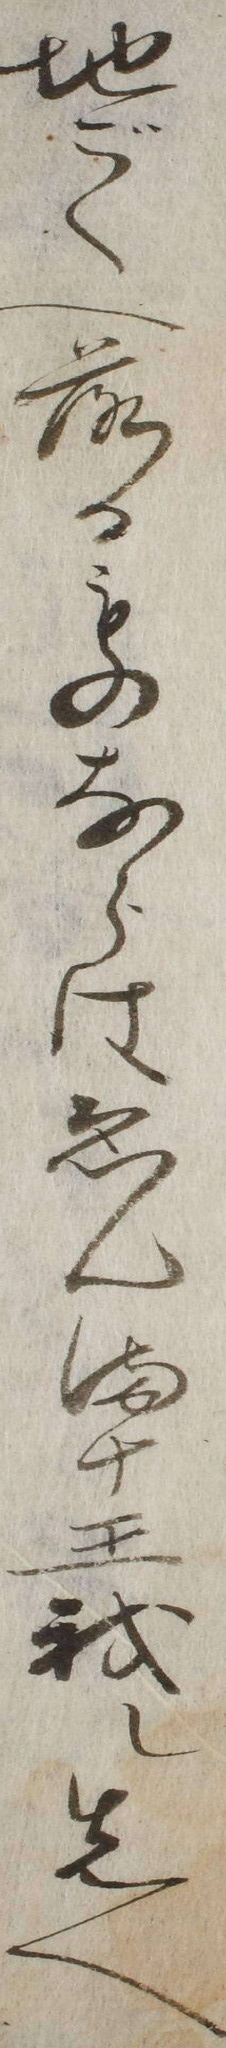地ごくへ落るものならはゑんま十王我れ先へ
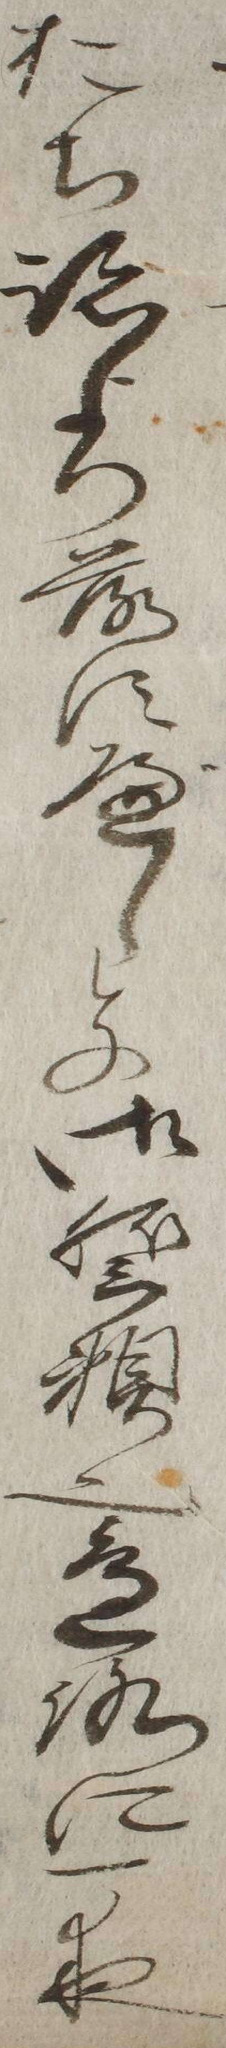おち跡より落すべしとの御請願也遍路に一夜
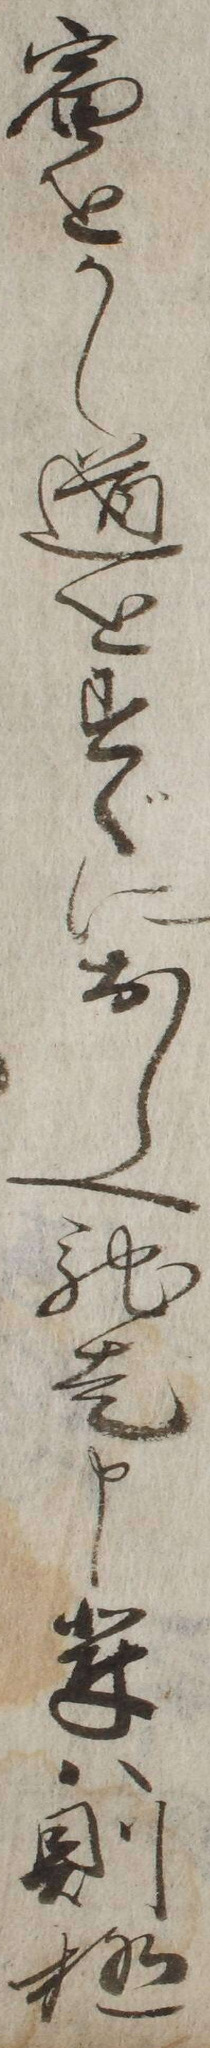宿をかし道をすぐにおしへ馳走申輩は則極
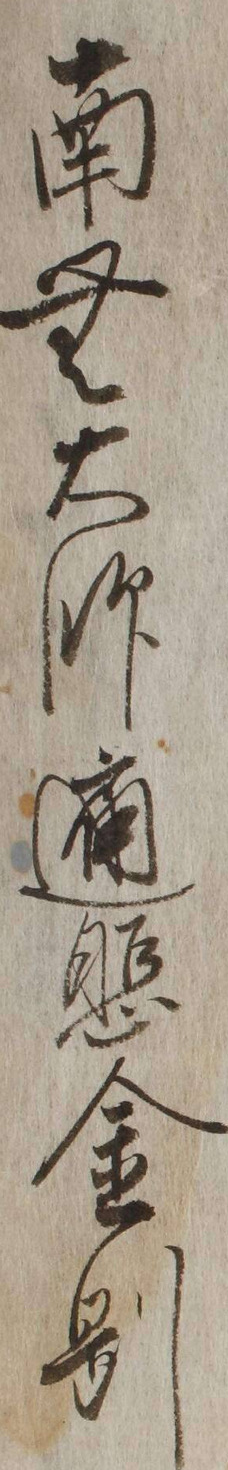南無大師通照金則

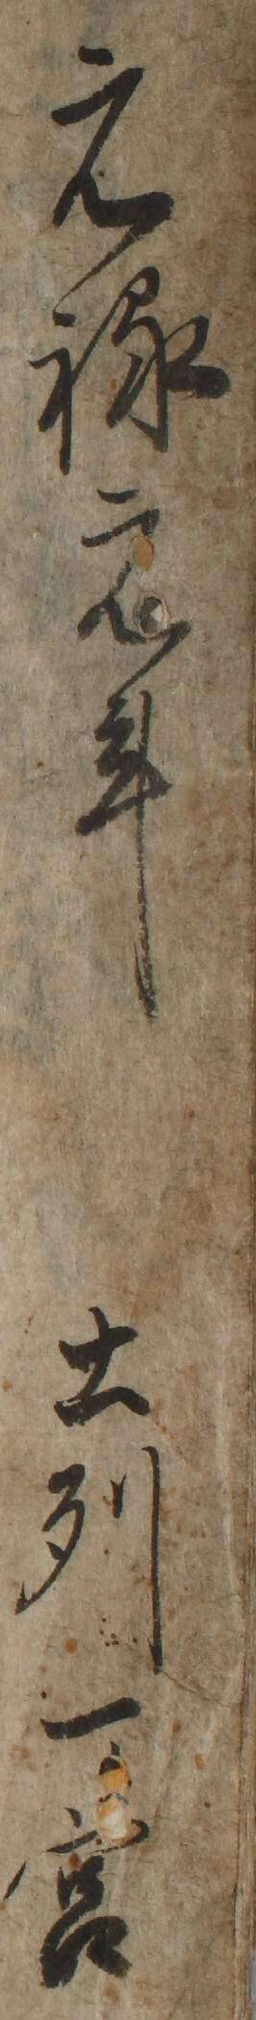元禄元年土州一宮
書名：奉弘法大師御傳記
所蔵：国文学研究資料館
